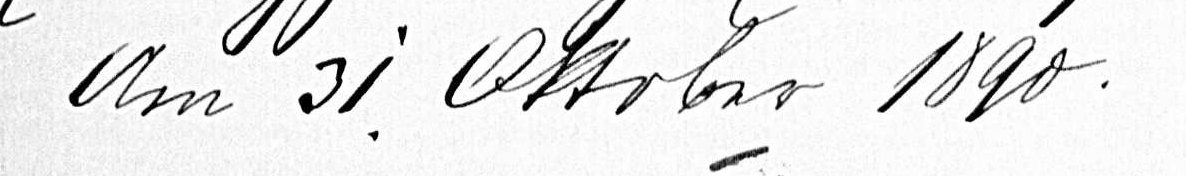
Am 31. Oktober 1890.
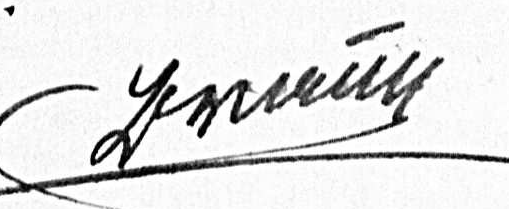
Braun
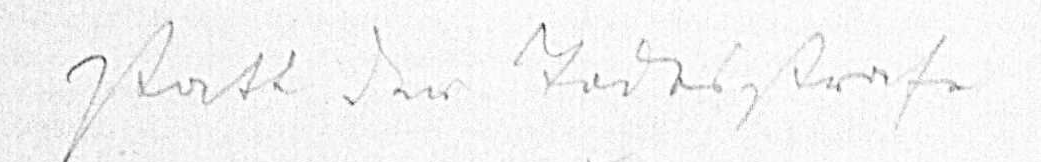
statt den Todesstrafe
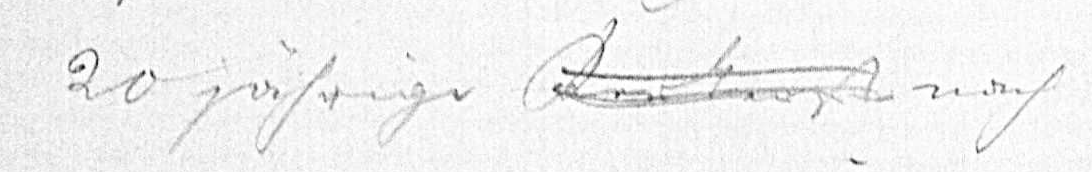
20jährige nach
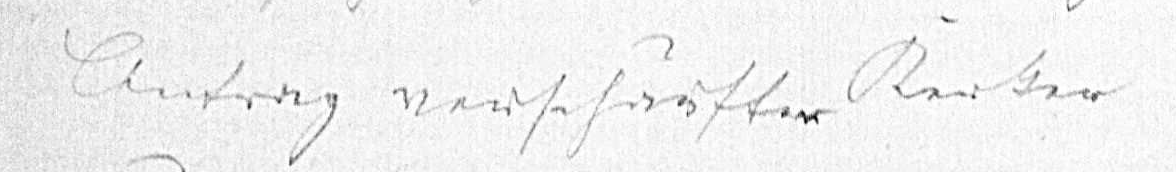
Antrag verschärfter Kerker
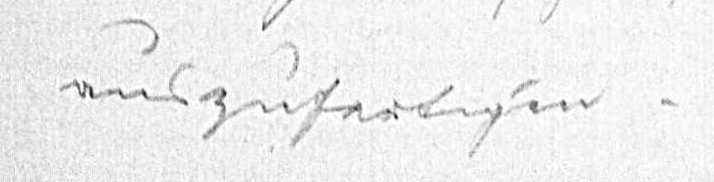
auszufertigen.
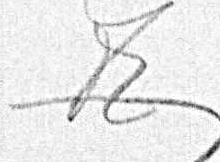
xx
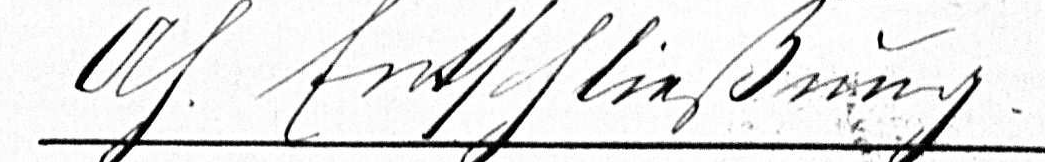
Ah. Entschließung.
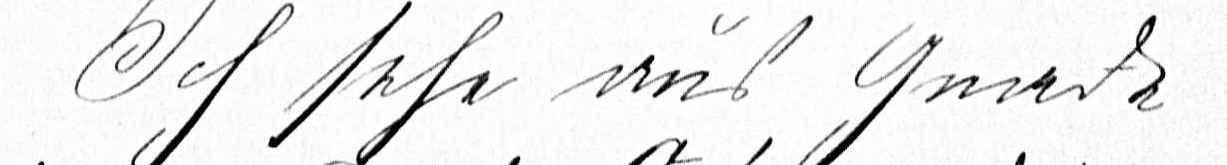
Ich sehe aus Gnade
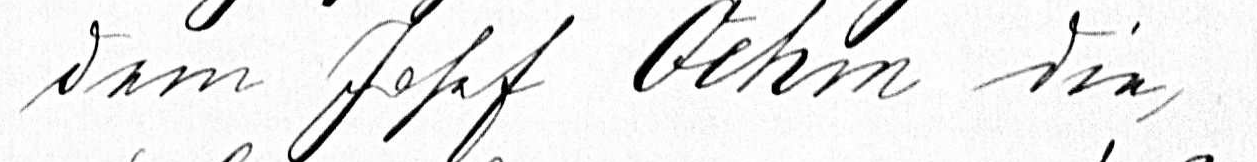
dem Josef Oehm die,
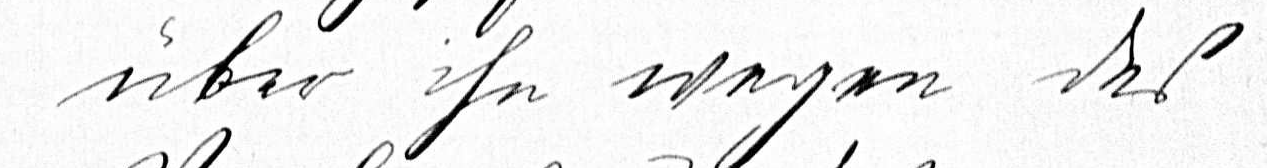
über ihn wegen des
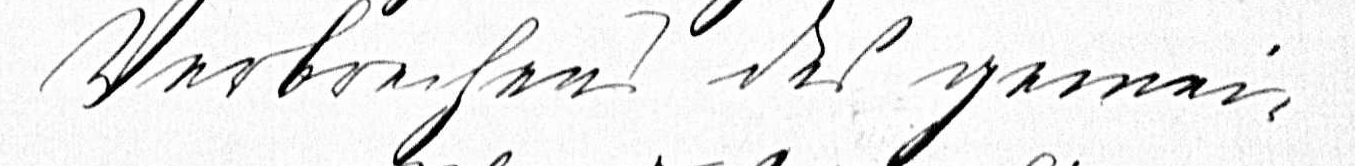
Verbrechens des gemei¬
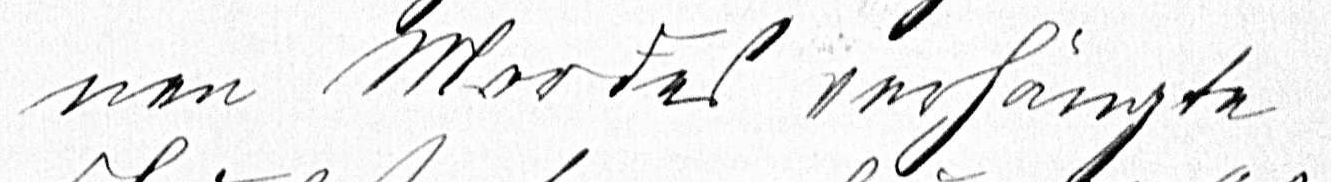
nen Mordes verhängte
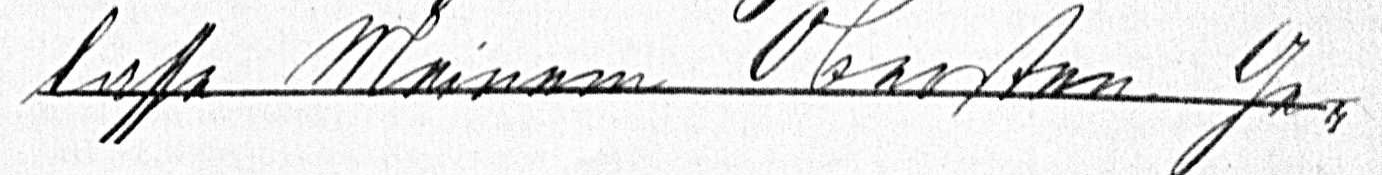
lasse Meinem Obersten. Ge¬
